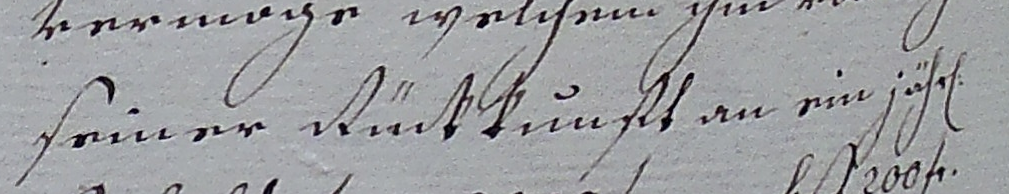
seiner Rückkunft an ein jährl:
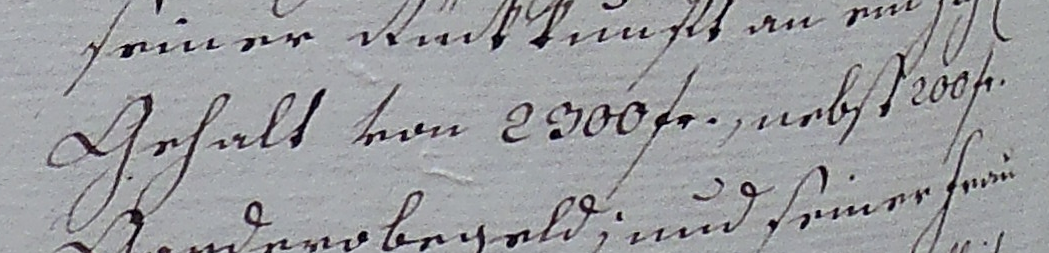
Gehalt von 2300fr., nebst 200fr.
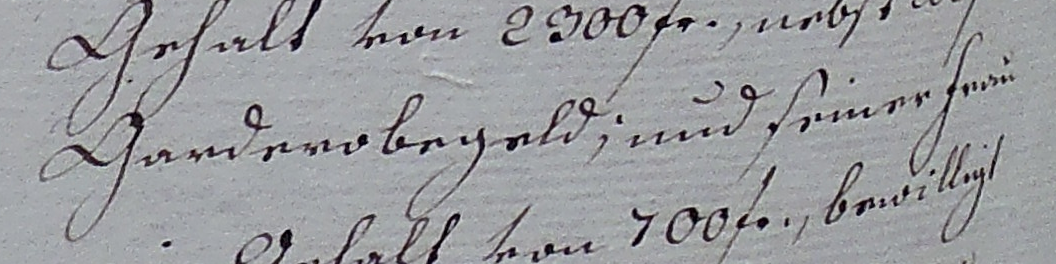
Garderobegeld; und seiner Frau
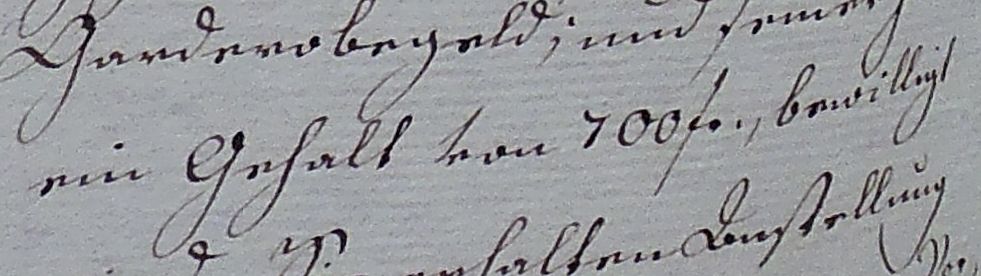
ein Gehalt von 700fr., bewilligt
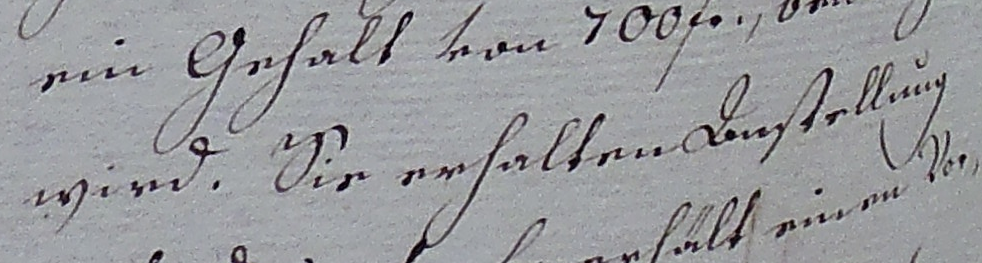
wird. Sie erhalten Anstellung
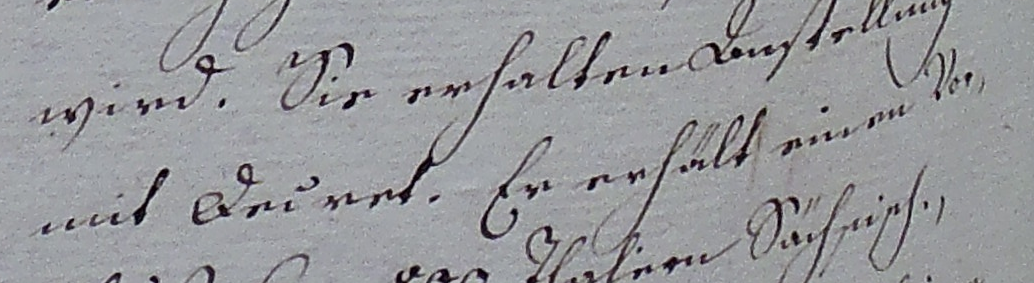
mit Decret. Er erhält einen Vor¬
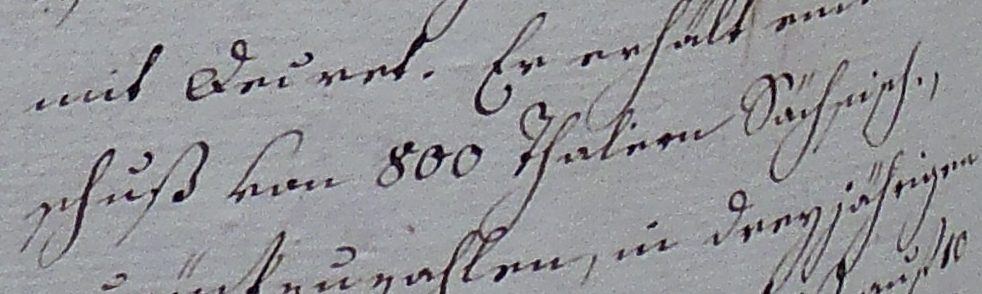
schuß von 800 Thalern Sächsische,
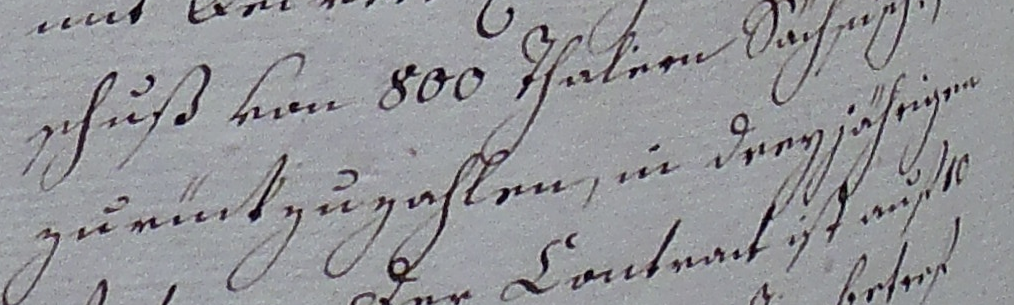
zurückzuzahlen, in drey jährigen
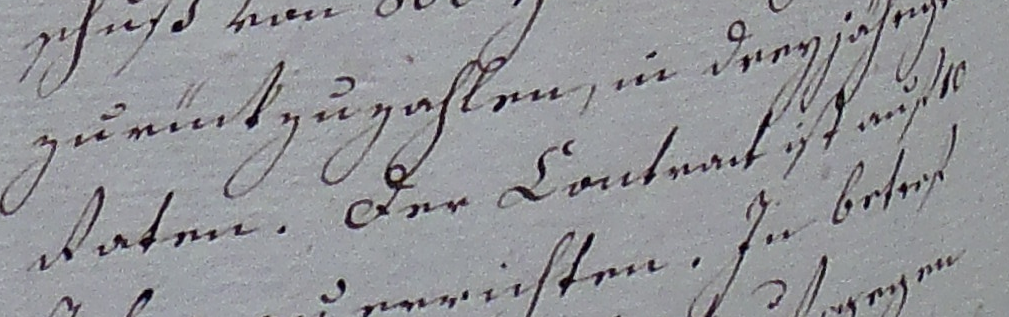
Raten. Der Contract it auf 10
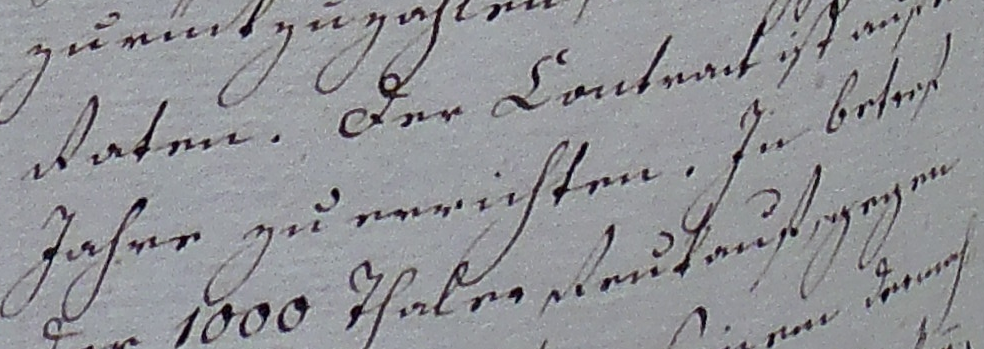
Jahre zu errichten. In betref
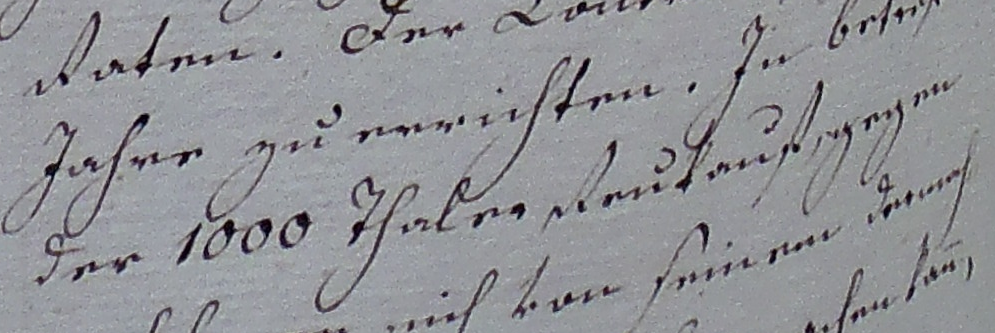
der 1000 Thaler Reukauf, gegen
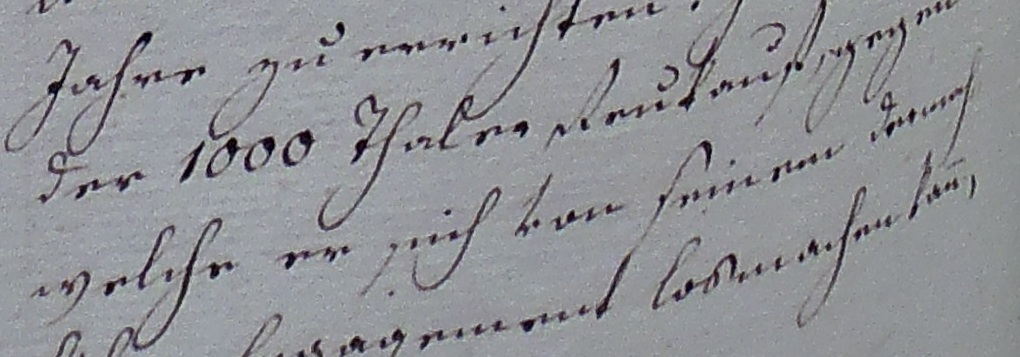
welche er sich von seinem dermah
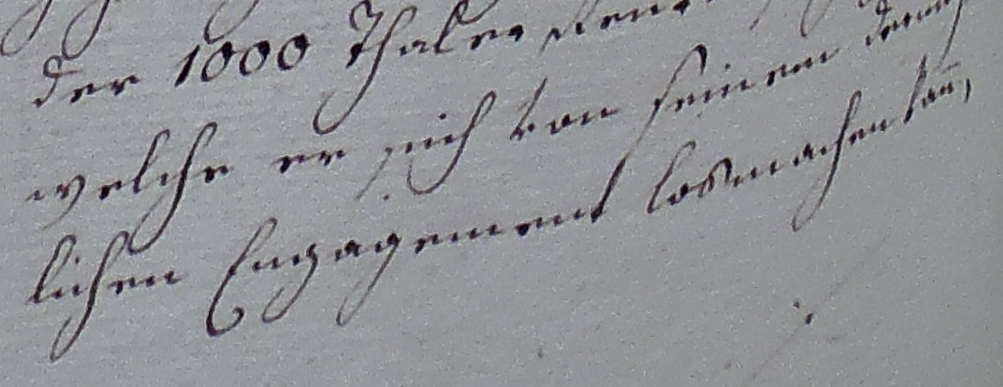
lichen Engagement losmachen kan̅,
